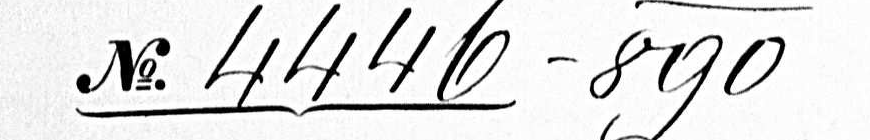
No. 4446 - 890
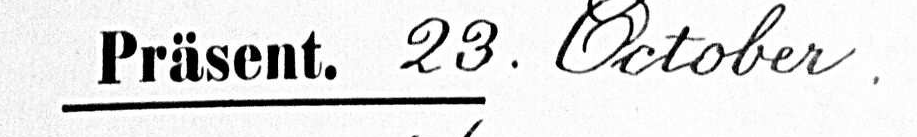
Präsent. 23. October.
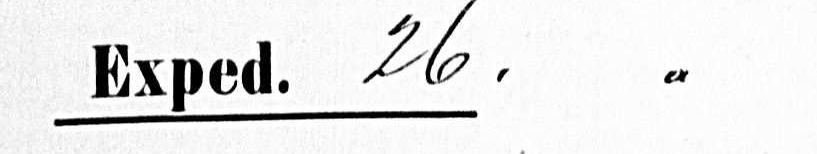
Exped. 26. October.
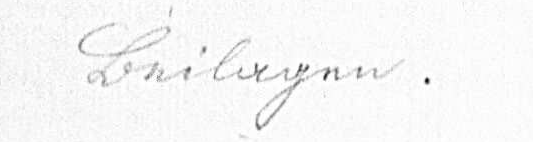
Beilagen.
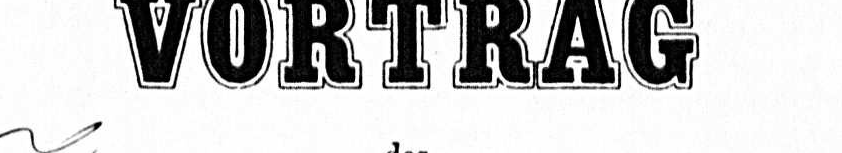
Vortrag
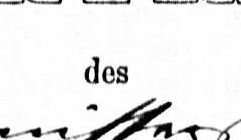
des
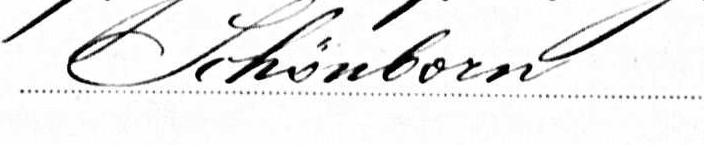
Schönborn
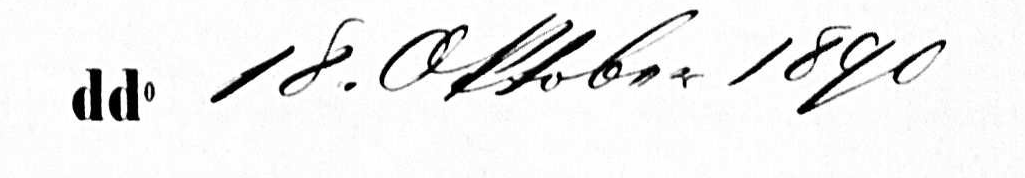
ddo 18. Oktober 1890
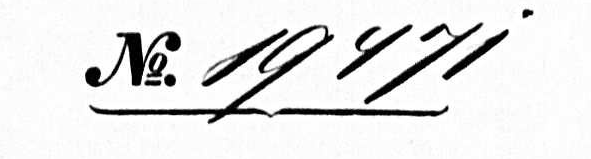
No. 19471
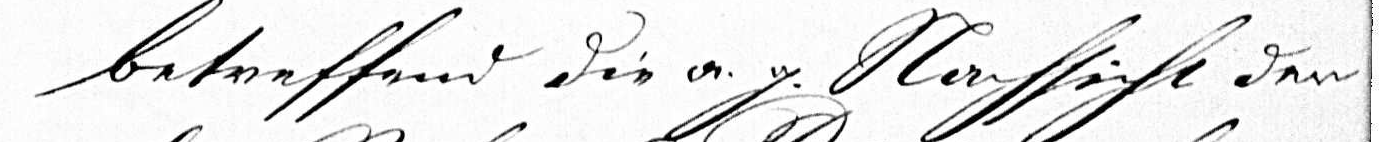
betreffend die a. g. Nachsicht den
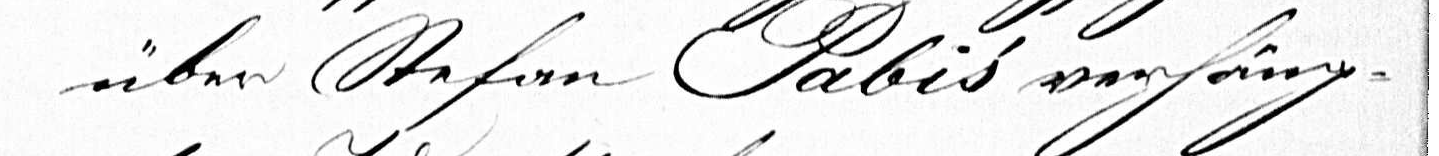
über Stefan Pabiś verhäng¬
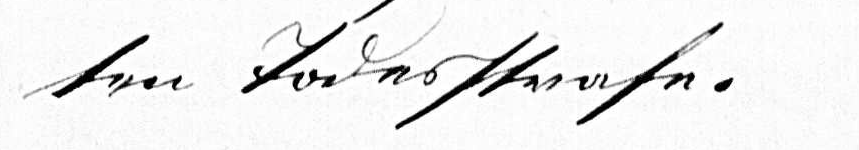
ten Todesstrafe.
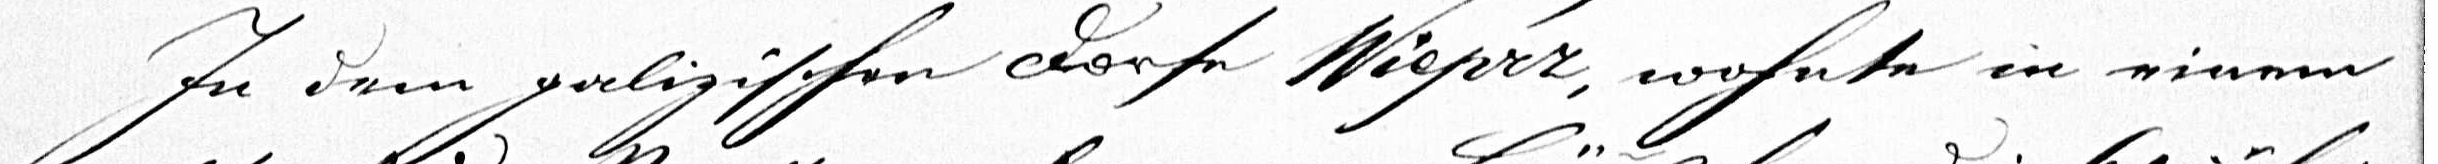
In dem galizischen Dorfe Wieprz, wohnte in einem
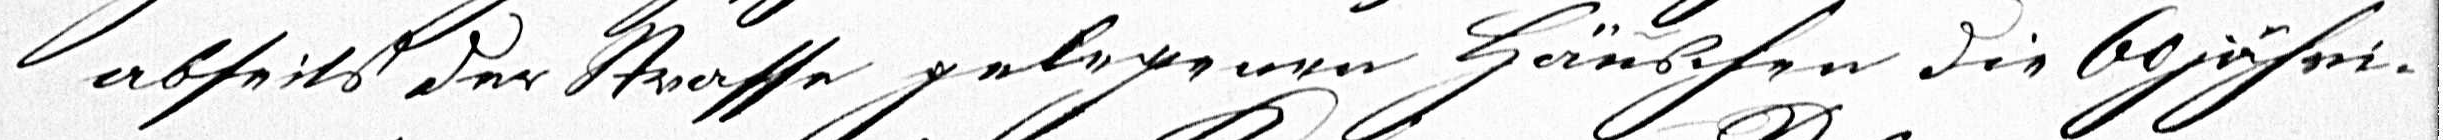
abseits der Strasse gelegenen Häuschen die 60jähri¬
